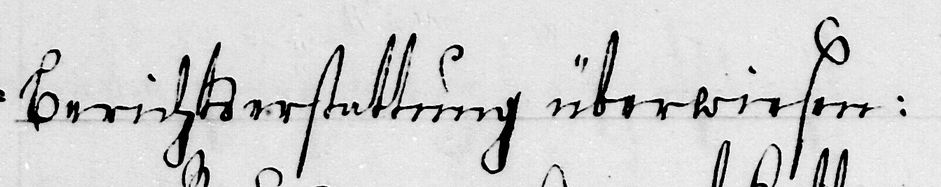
Berichtserstattung überwiesen:
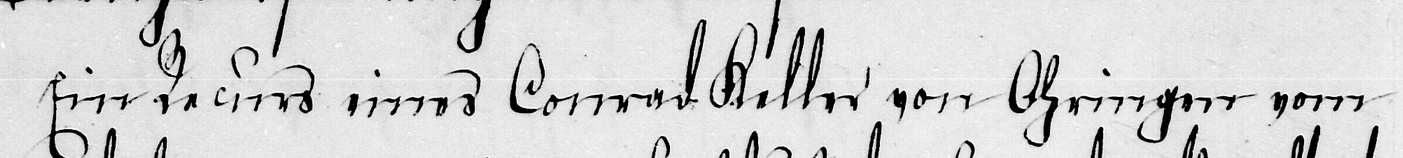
Ein Recurs eines Conrad Keller von Ohringen vom
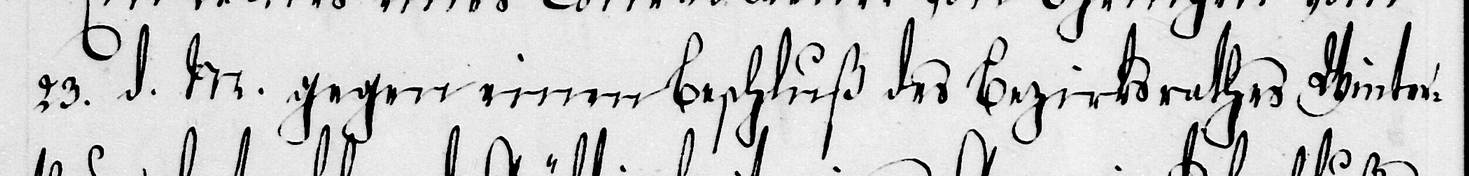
23. d. M. gegen einen Beschluß des Bezirksrathes Winter¬
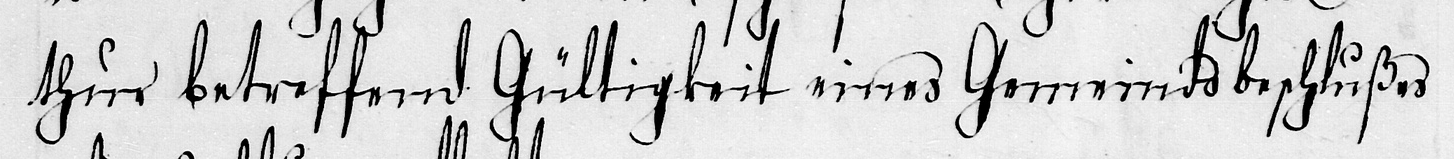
thur betreffend Gültigkeit eines Gemeindsbeschlußes
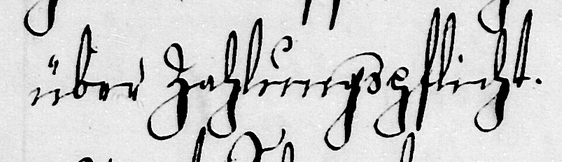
über Zahlungspflicht.
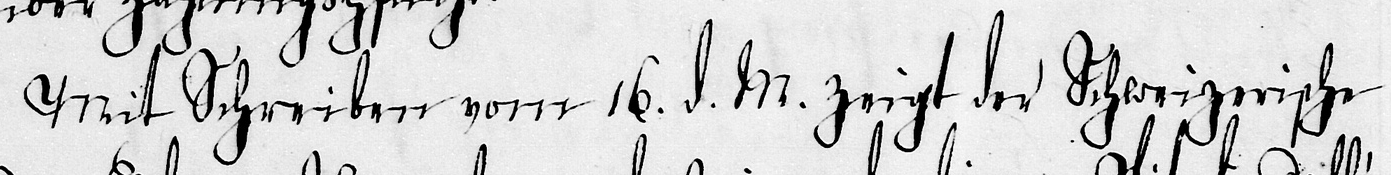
Mit Schreiben vom 16. d. M. zeigt der Schweizerische
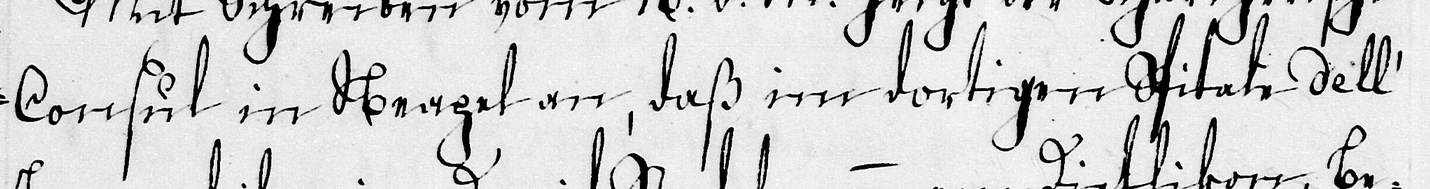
Consul in Neapel an, daß im dortigen Spitale dell’
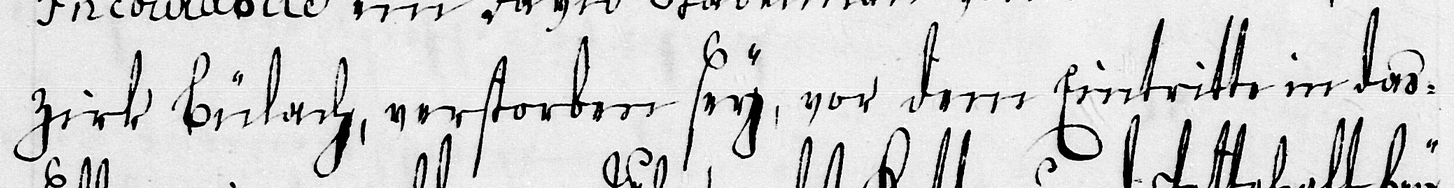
zirk Bülach, verstorben sey, vor dem Eintritte in das¬
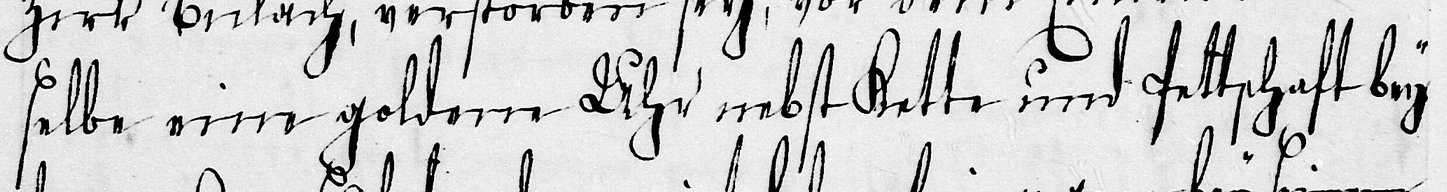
selbe eine goldene Uhr nebst Kette und Pettschaft bey
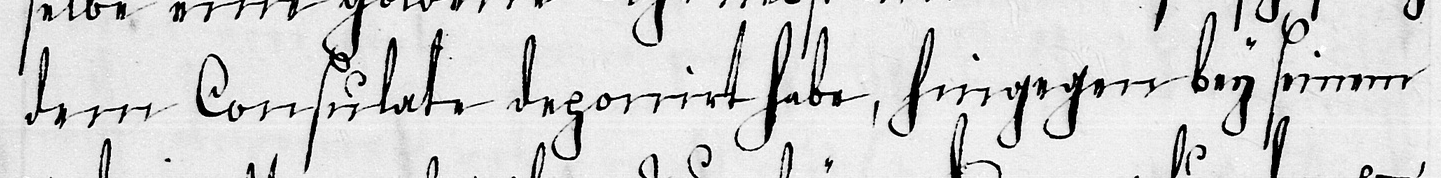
dem Consulate deponirt habe, hingegen bey seinem
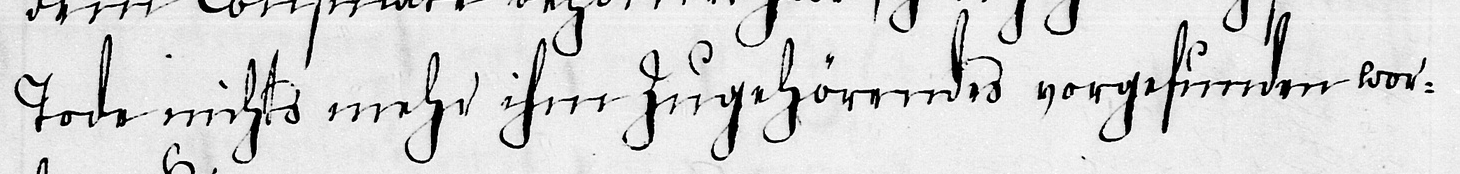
Tode nichts mehr ihm Zugehörendes vorgefunden wor¬
